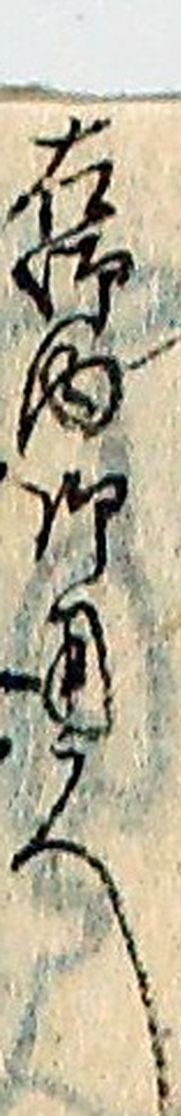右御内御目附
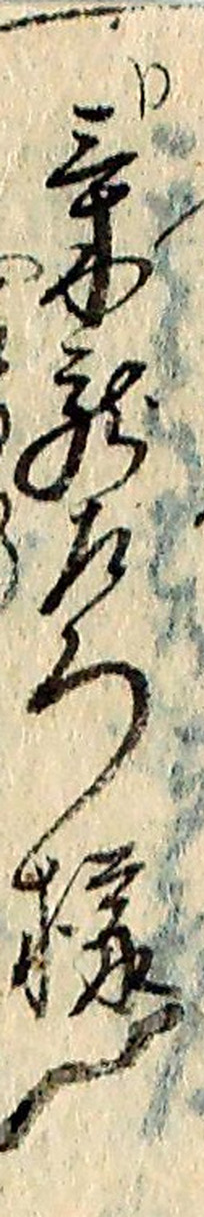三木龍左衛門様
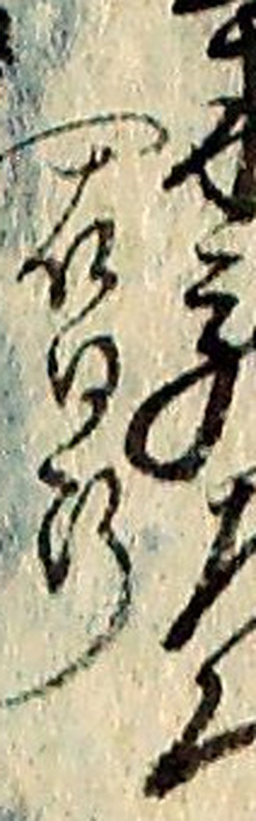右同断
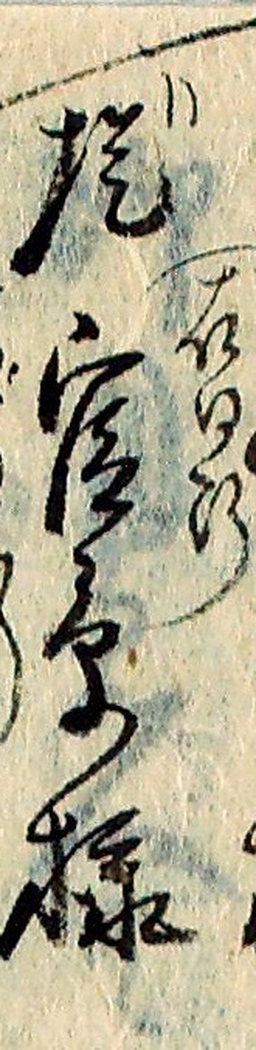堤官兵衛様
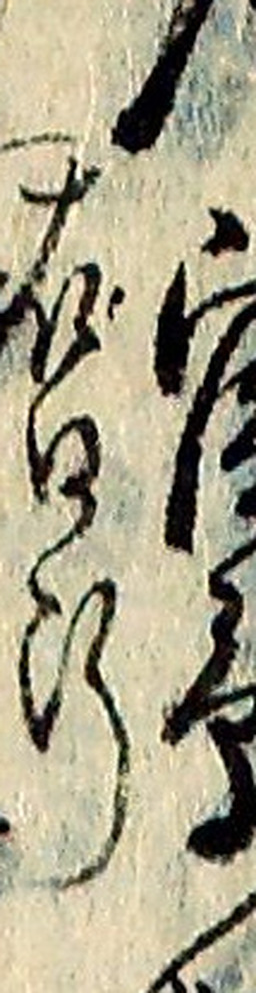右同断
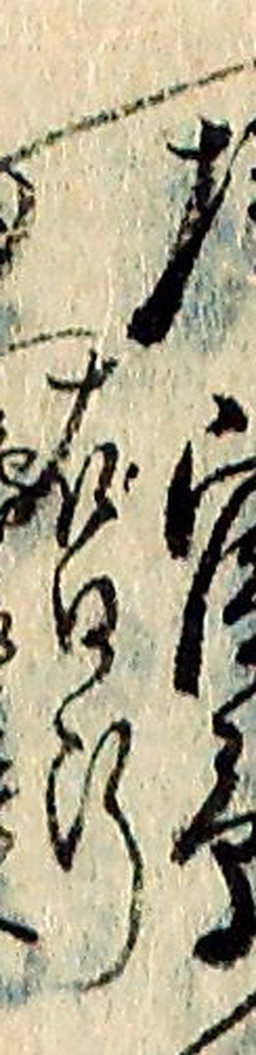右同断
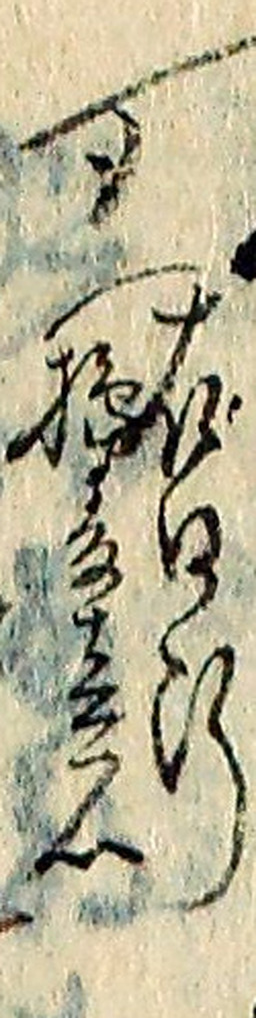搗麦壱石
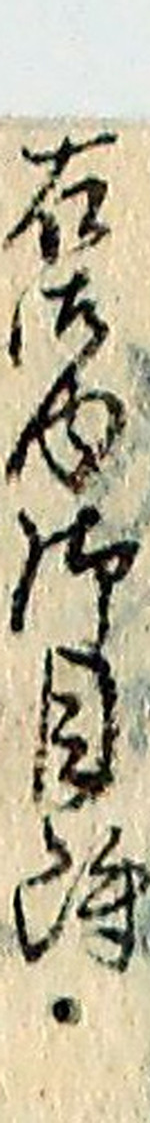右御内御目附
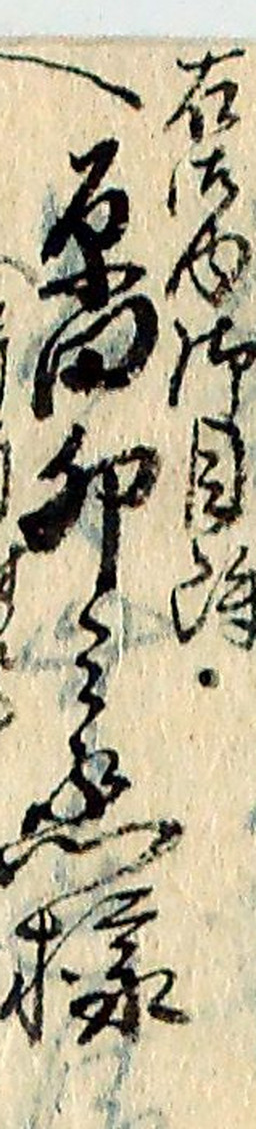原田卯之丞様
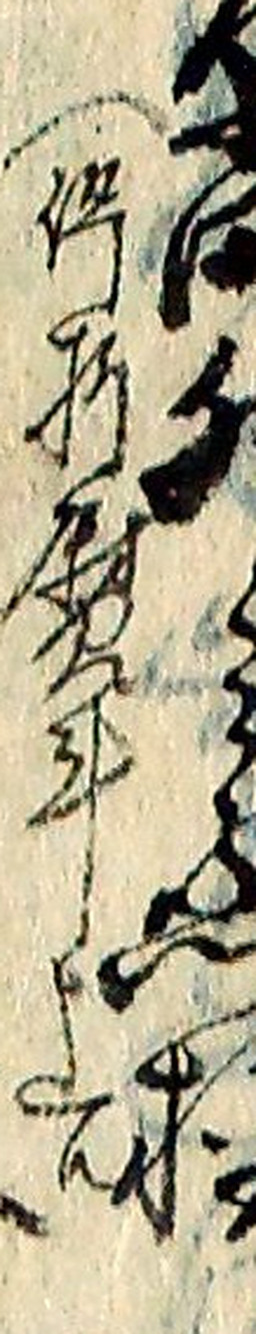但し折熨斗上る
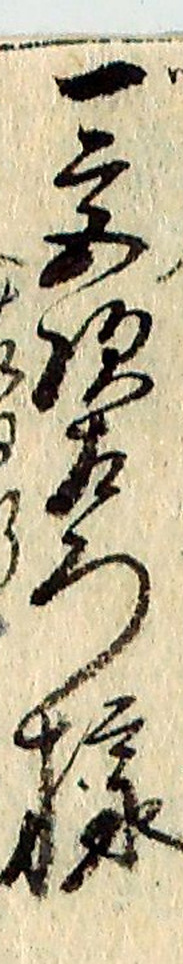一宮次左衛門様
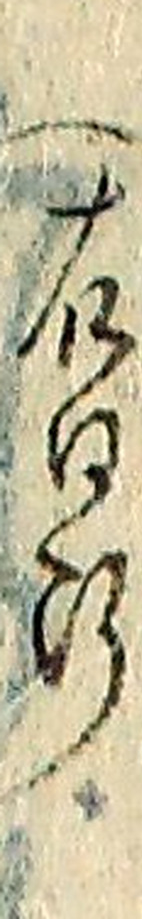右同断
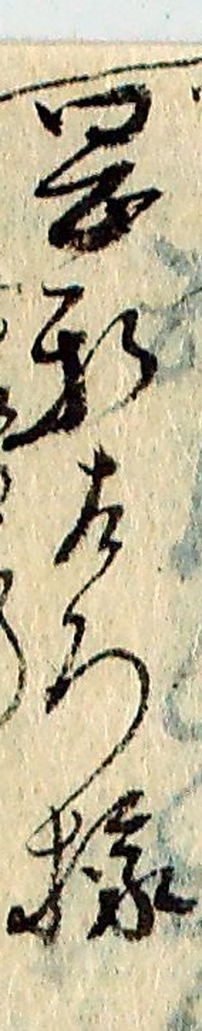岡新左衛門様
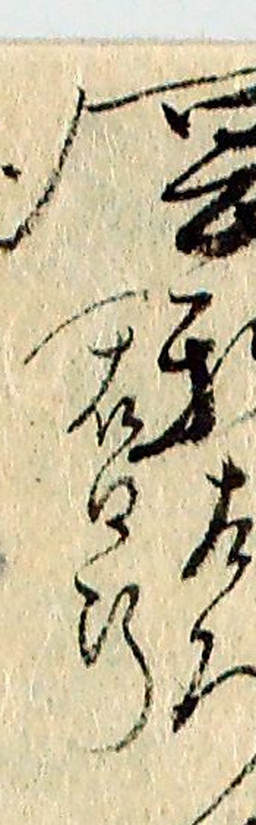右同断
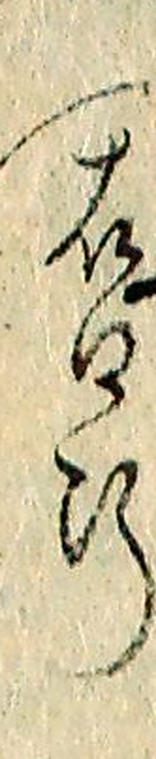右同断
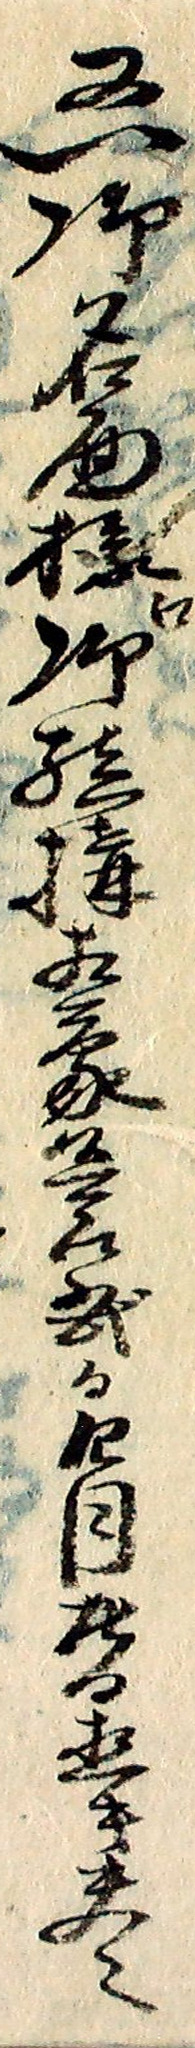右御名面様え御結構相蒙候節当日四月廿日直き夫々
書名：諸御願書控(後藤氏壱番）
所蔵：鳴門教育大学 Naruto University of Education
